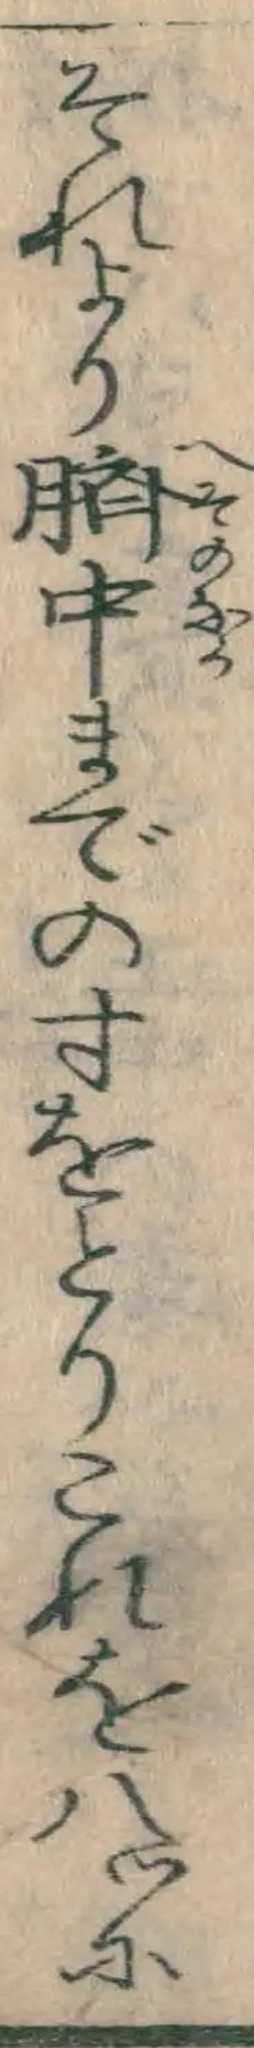それより臍中までの寸をとりこれを八ッに

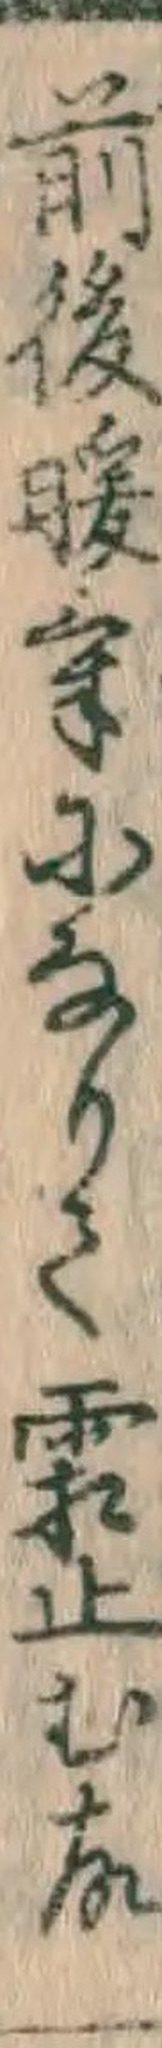前後暖気になりて霜止む故
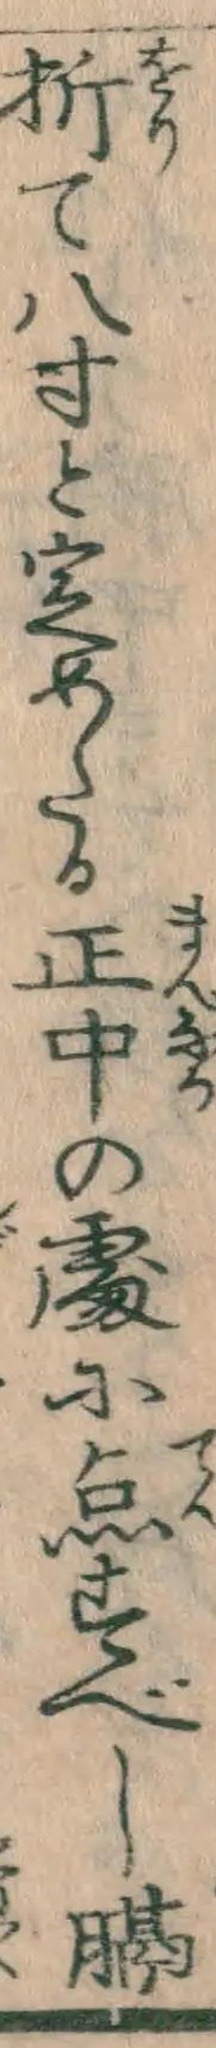折て八寸と定めたる正中の処に点すべし膈
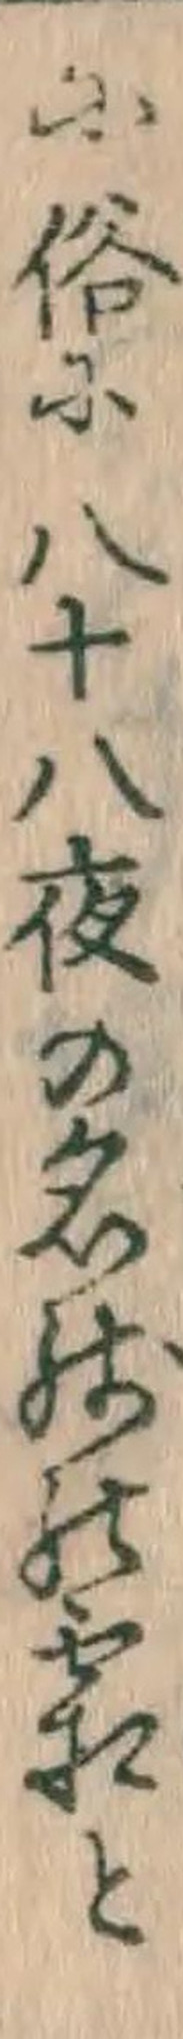に俗に八十八夜の名残の霜と
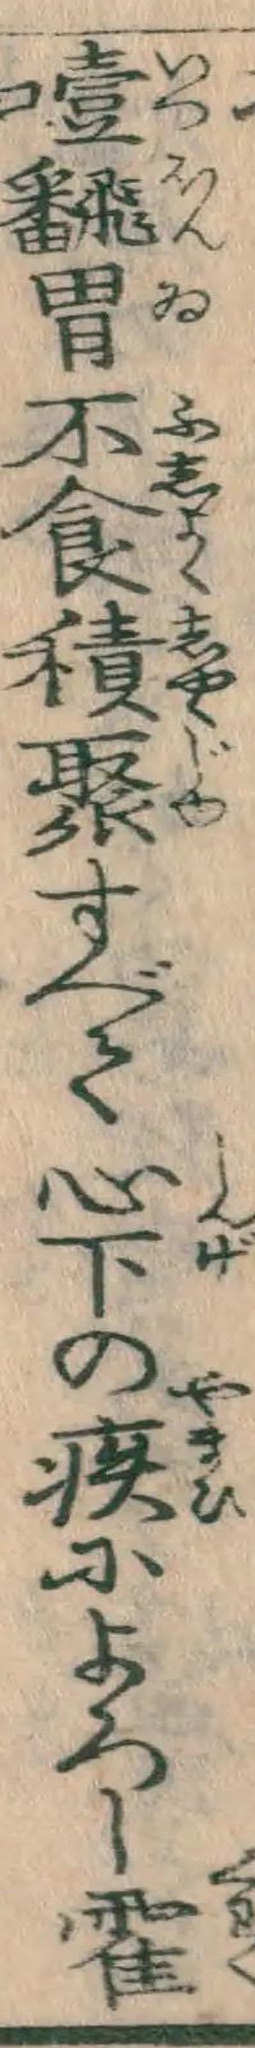噎翻胃不食積聚すべて心下の疾によろし霍
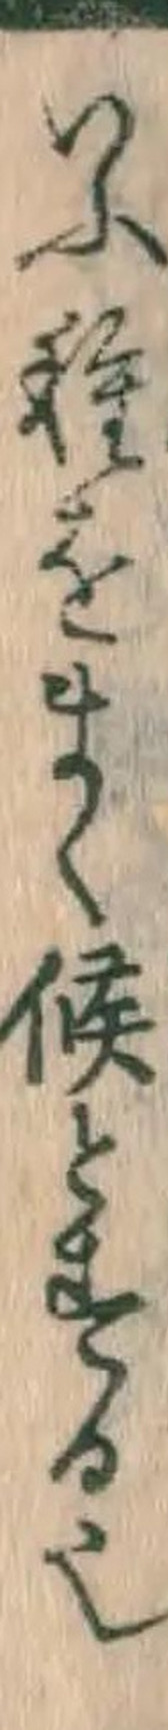いふ種をまく候とする也
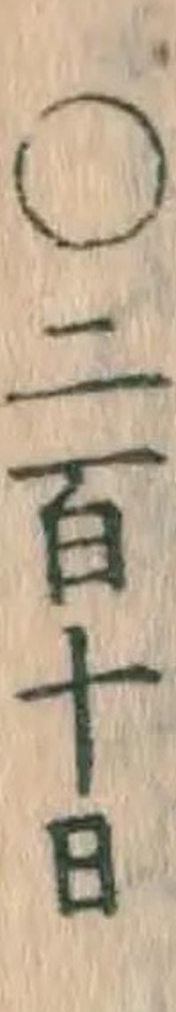○二百十日
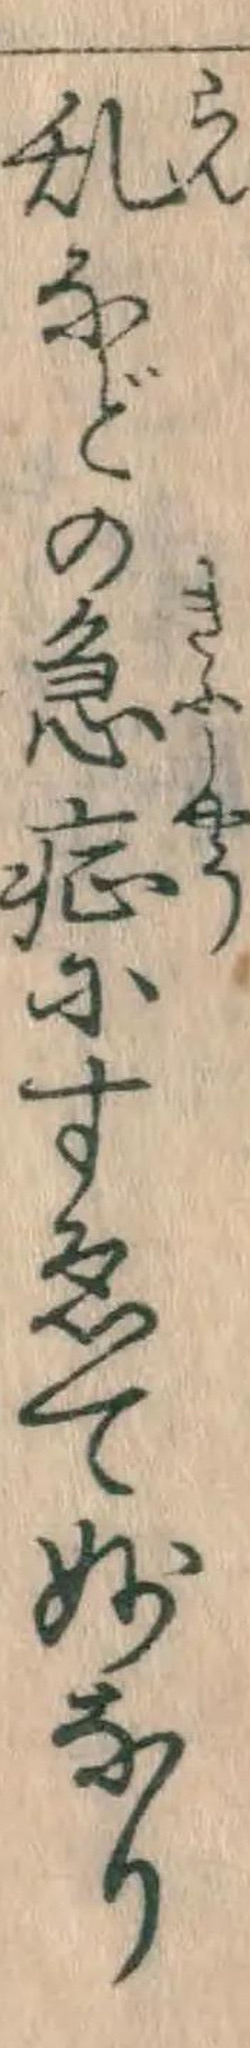乱などの急症にすゑて妙なり
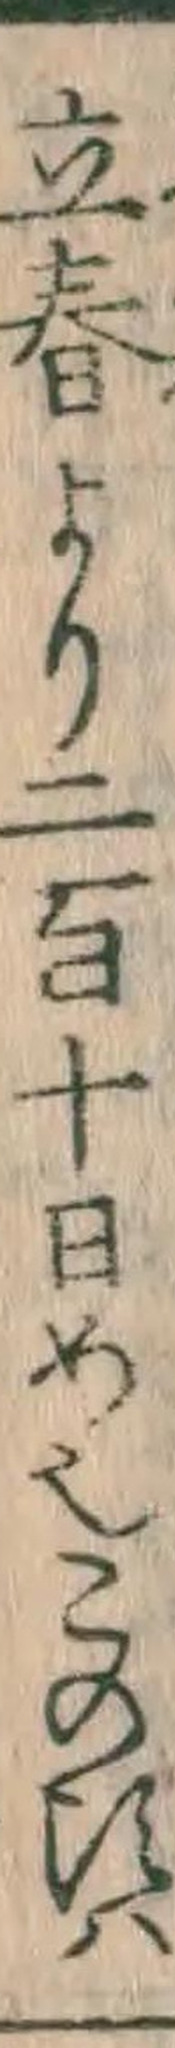立春より二百十日め也この頃は
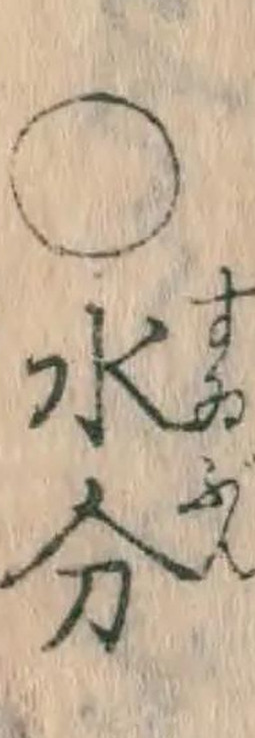○水分
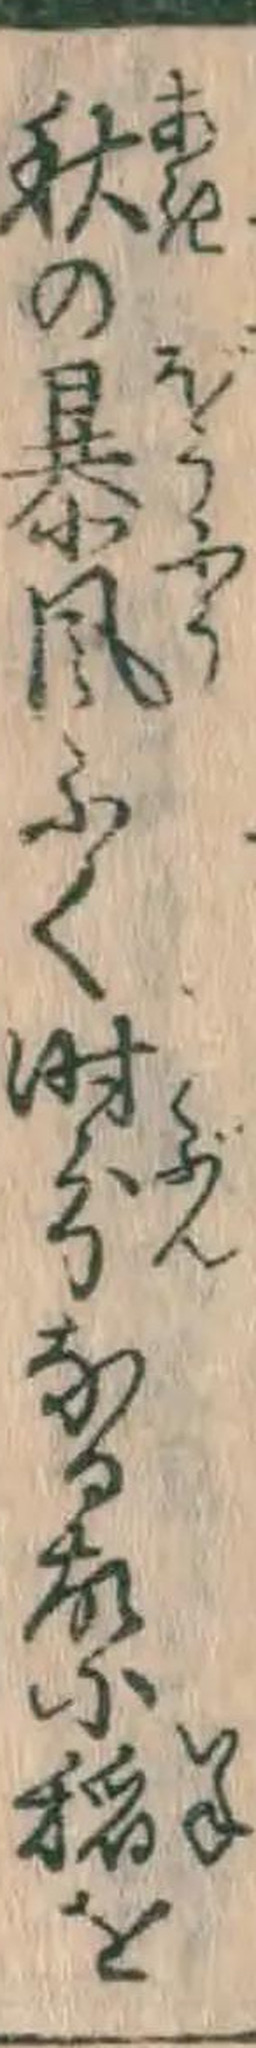秋の暴風ふく時分なる故に稲を
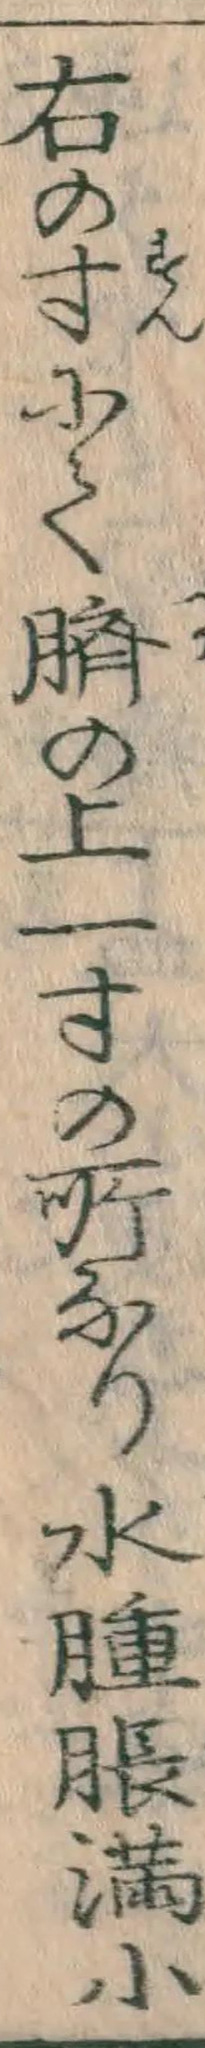右の寸にて臍の上一寸の所なり水腫脹満小
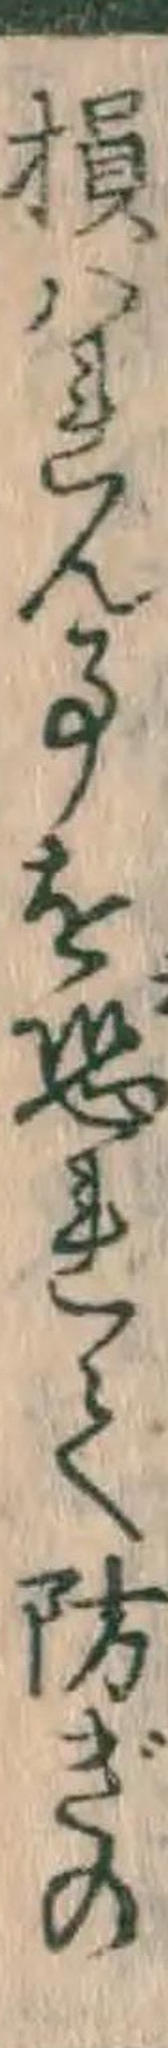損はれん事を恐れて防ぎの
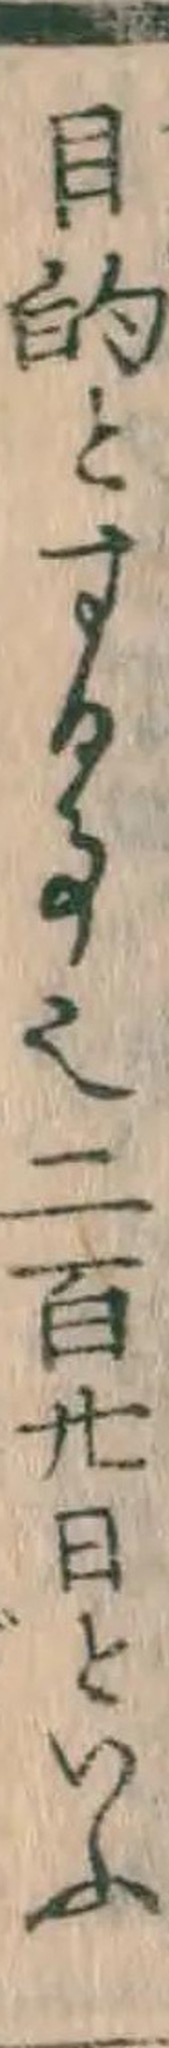目的とする事也二百廿日といふ
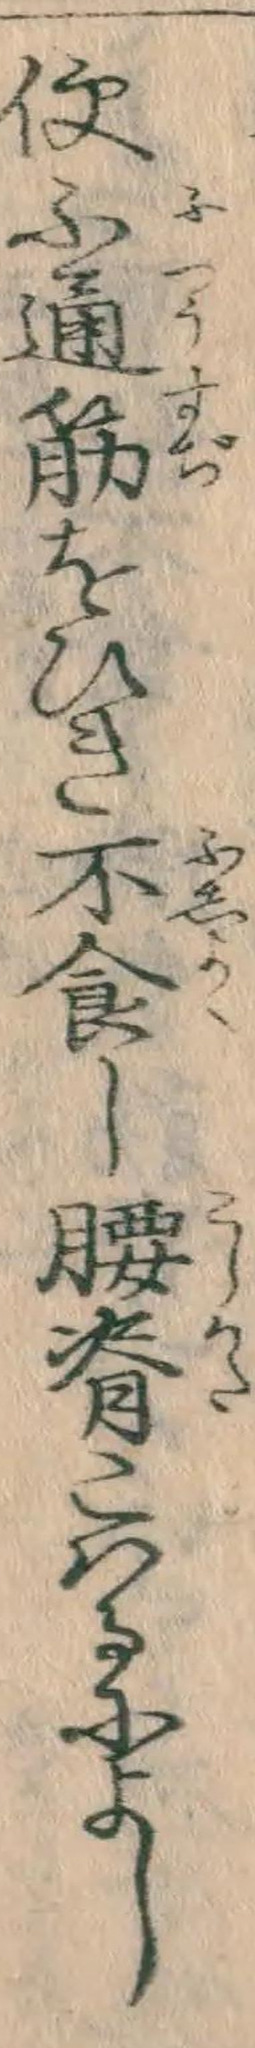便不通筋をひき不食し腰脊こはるによし
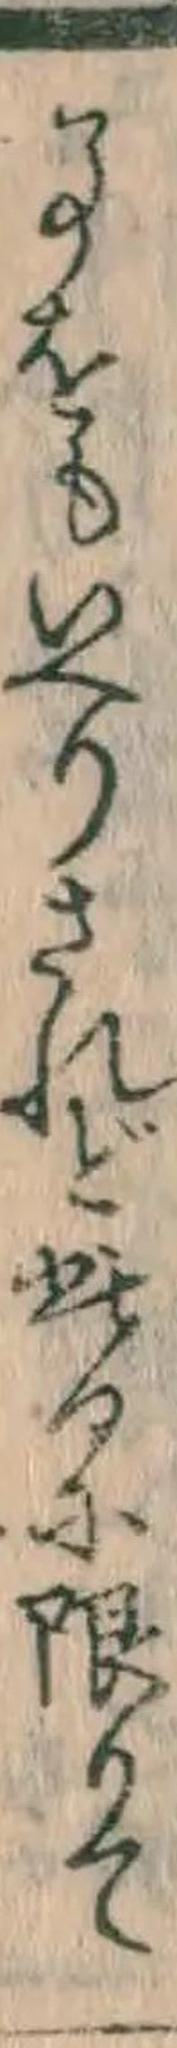事をもいへりされど此日に限りて
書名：広益秘事大全 3巻. [4]
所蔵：国立国会図書館 National Diet Library, JAPAN
